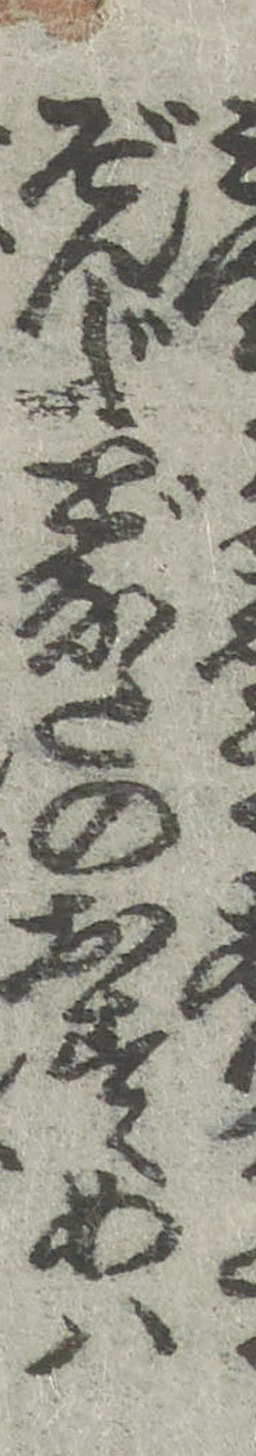ぞんじどなたのおすゝめは
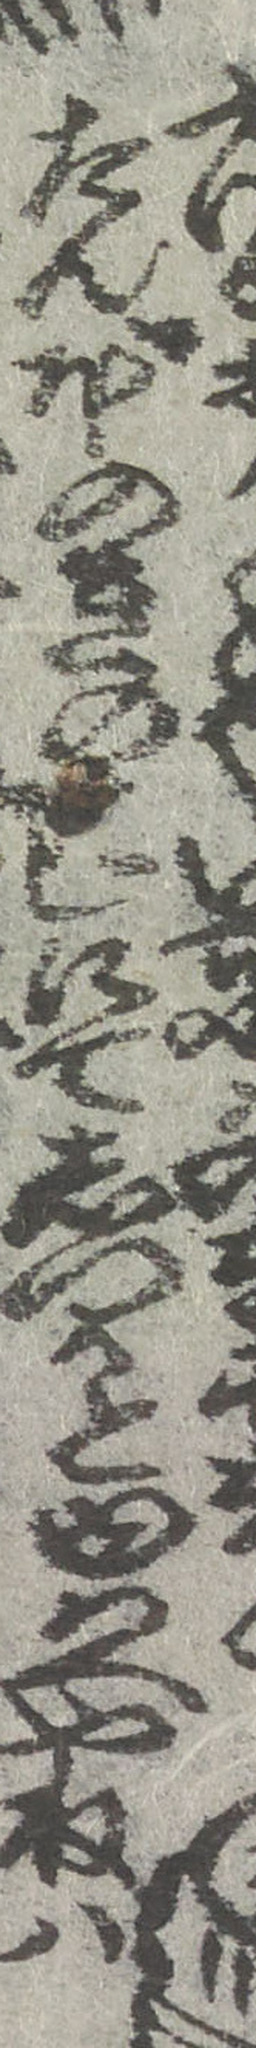たんぼのきのじにてしつかとゆはへやねは
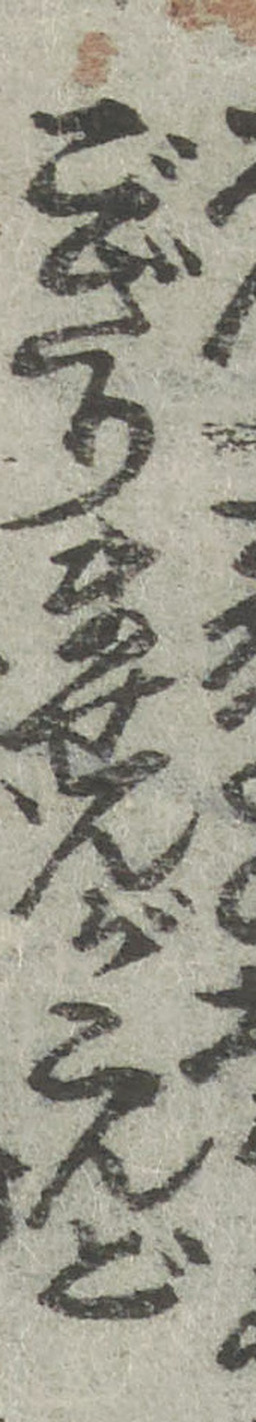ござりませんがこんど
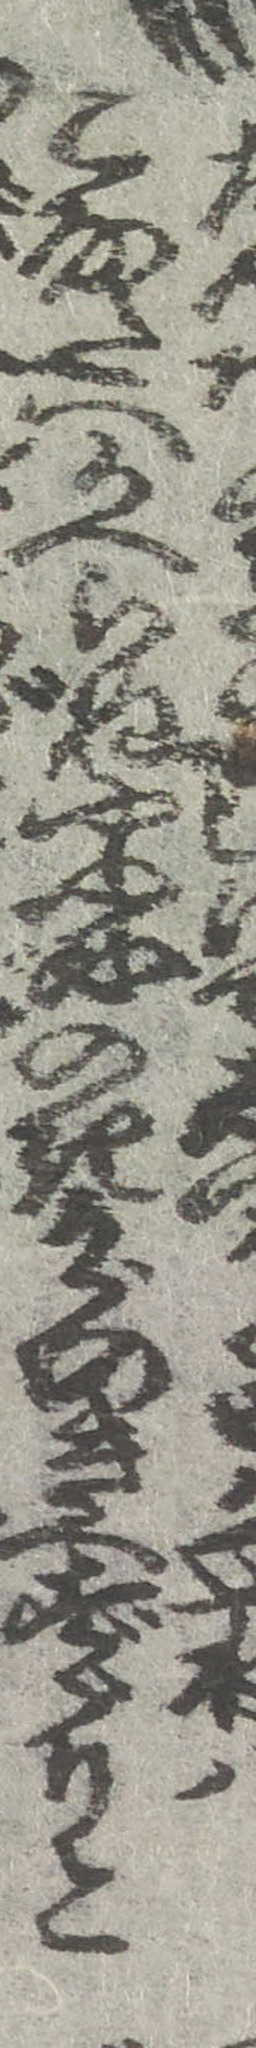こなたへかへらぬやふにのきからのきへずらりと
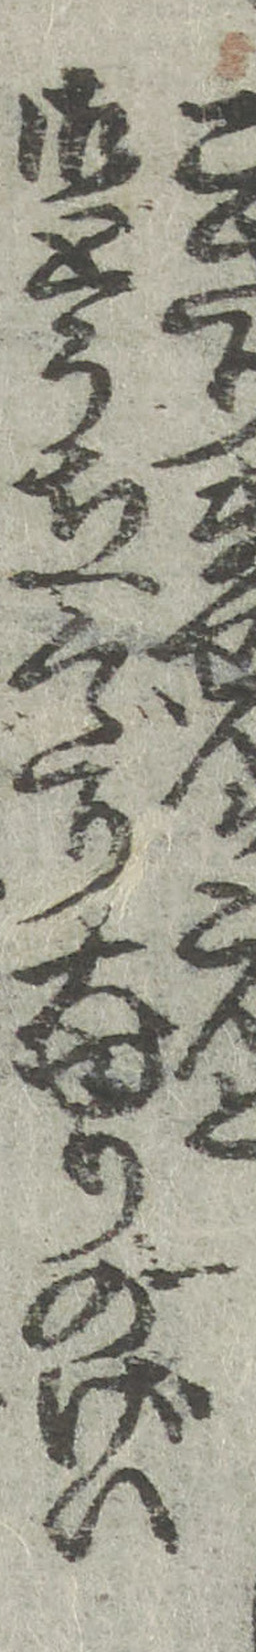御とうちへくだり大ゆりのげい
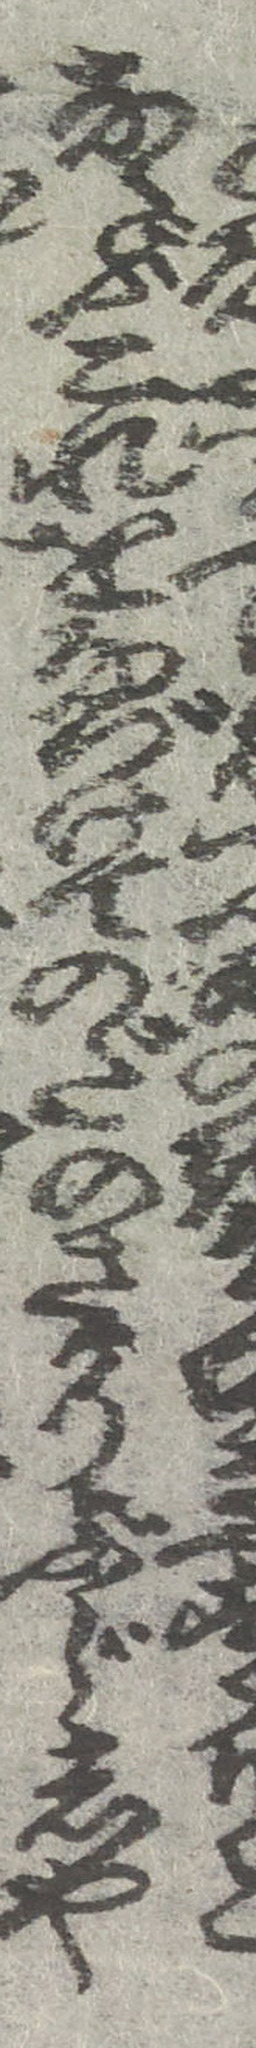ならぶこれをなづけてのだのさかりぶじしや
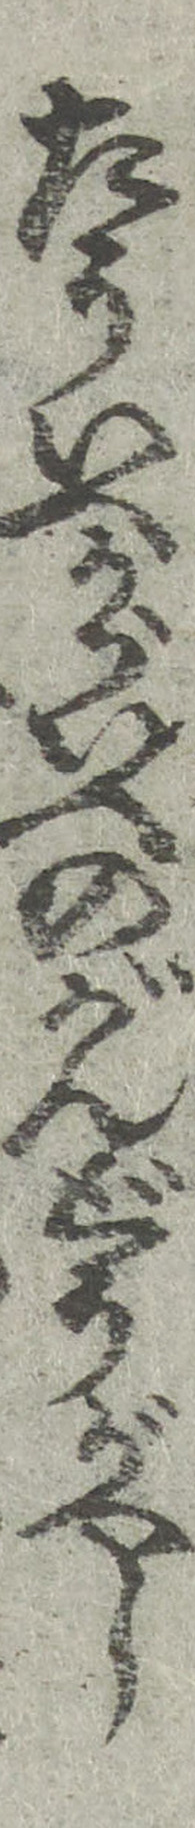たういへからいへのがんどうがへし
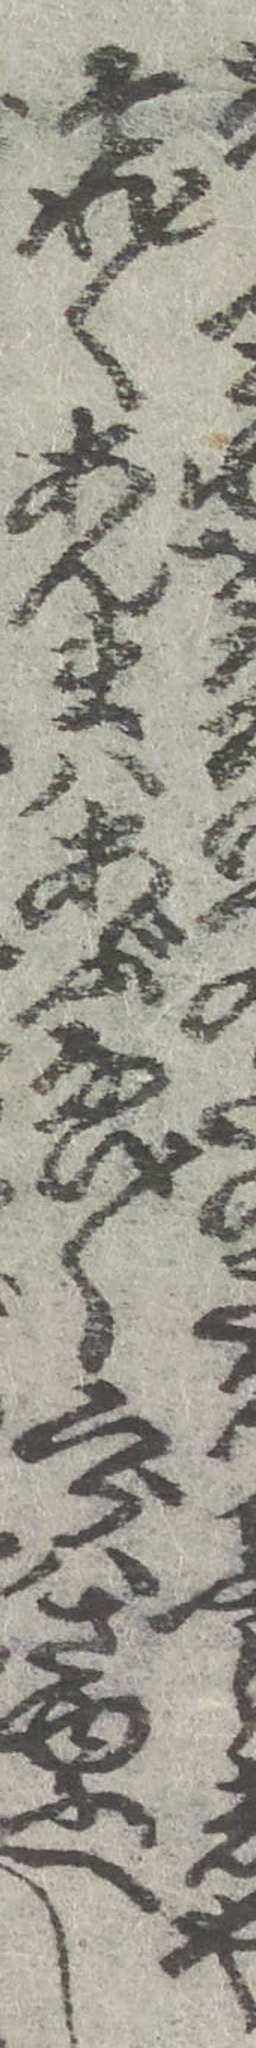それ〳〵あんまはあぶない〳〵くらはさゆふへ
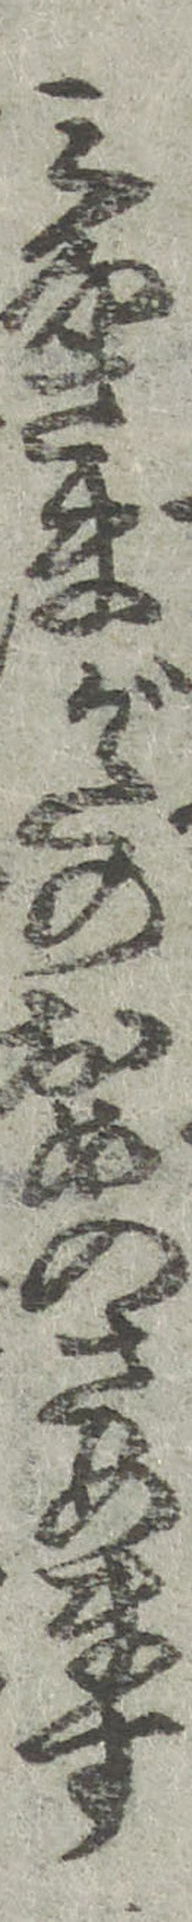みなさまがたのおめのさめます
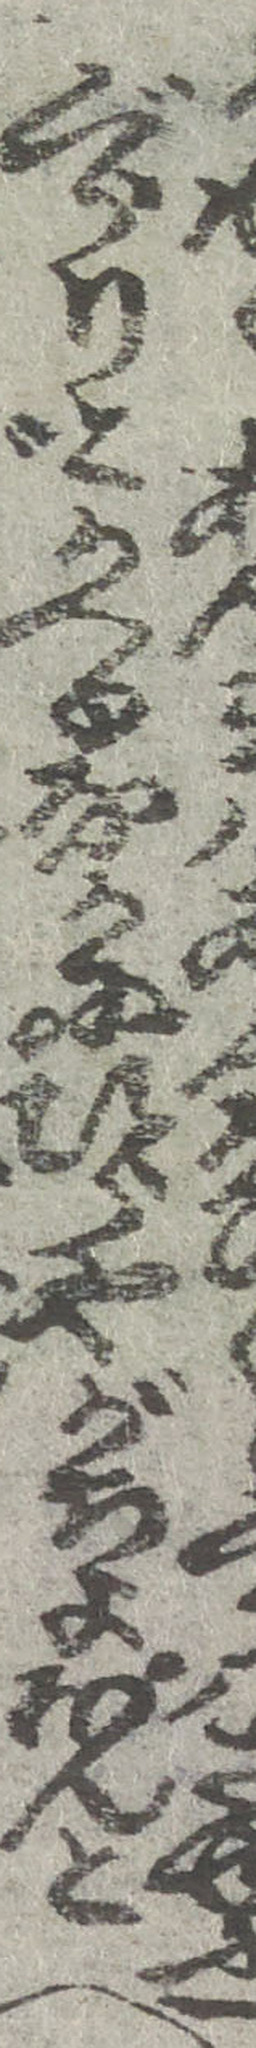ぐらりとかえるなかにひらやがちよぽんと
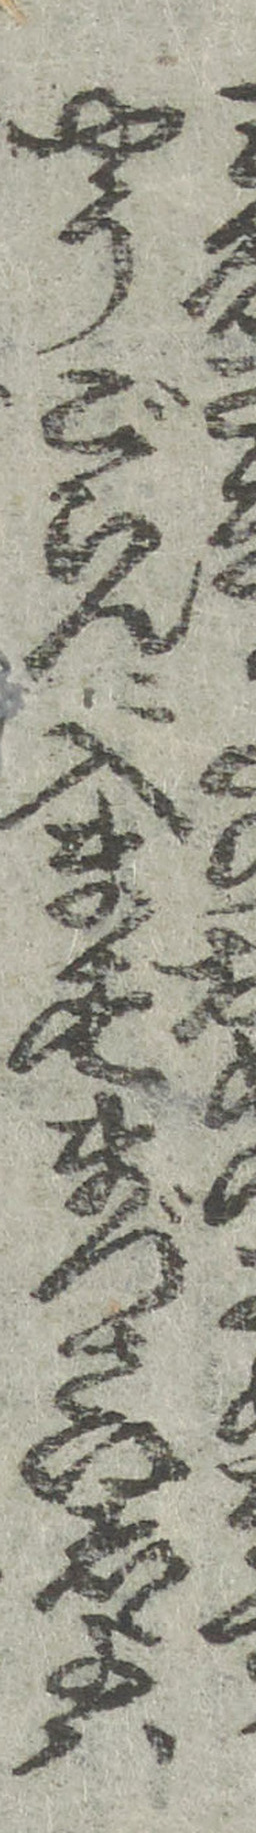やうごらんに入ますまづさいしよは
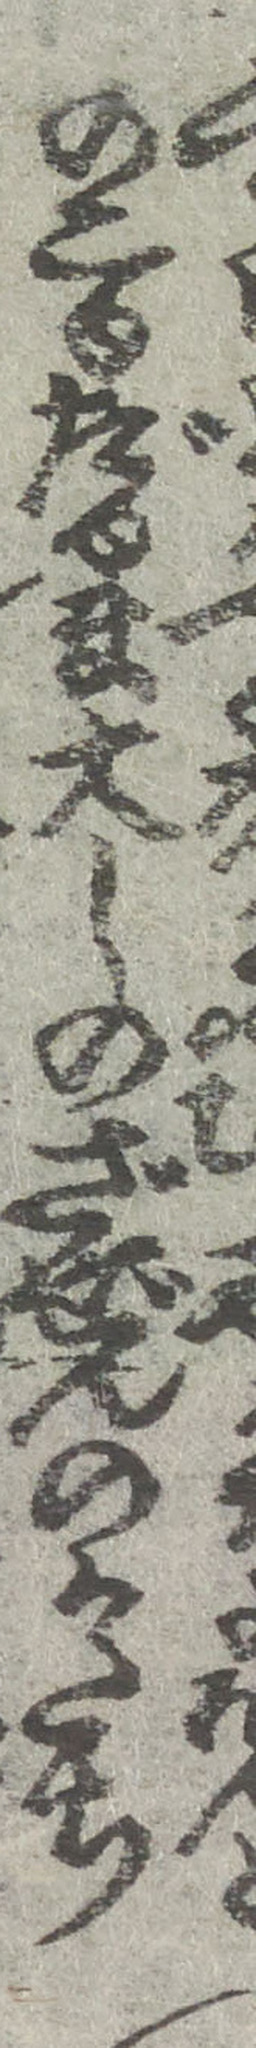のこるだるま大しのざぜんのかたち
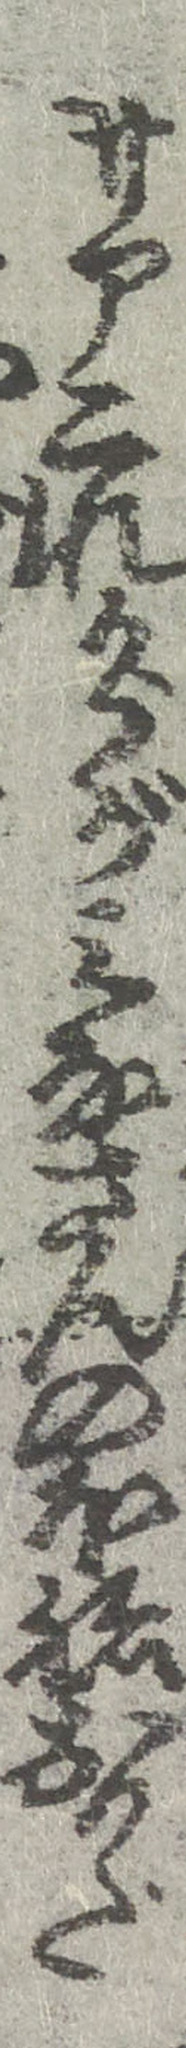サアこれからがみなさんのほねおりだ
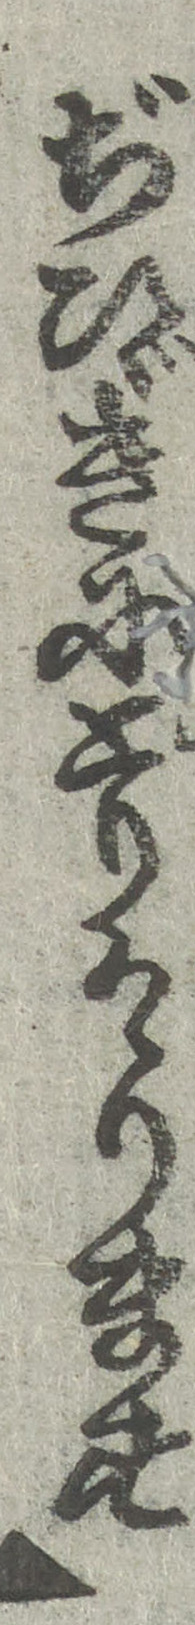ぢひゞきにとりかゝります
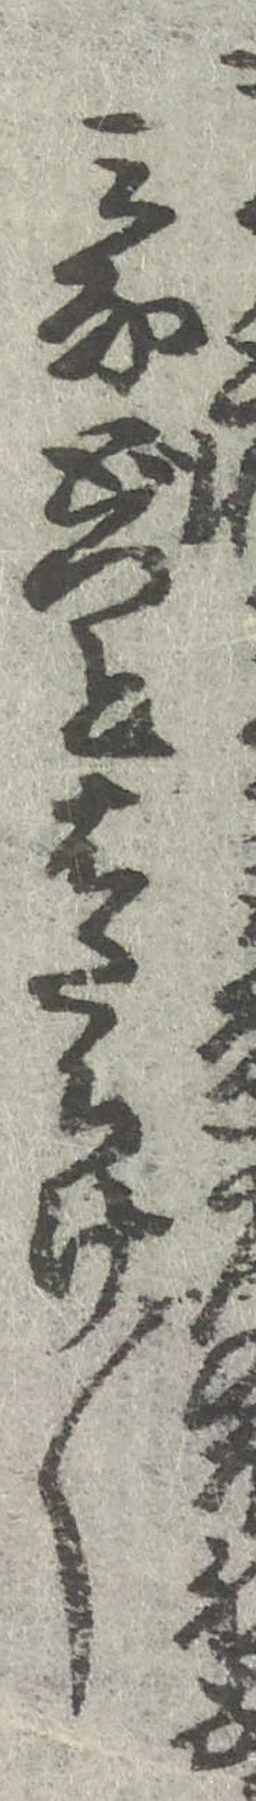みなどつとはたらけ〳〵
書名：大坂下りなまづのかるわざ
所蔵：東京大学総合図書館 General Library in the University of Tokyo, JAPAN
